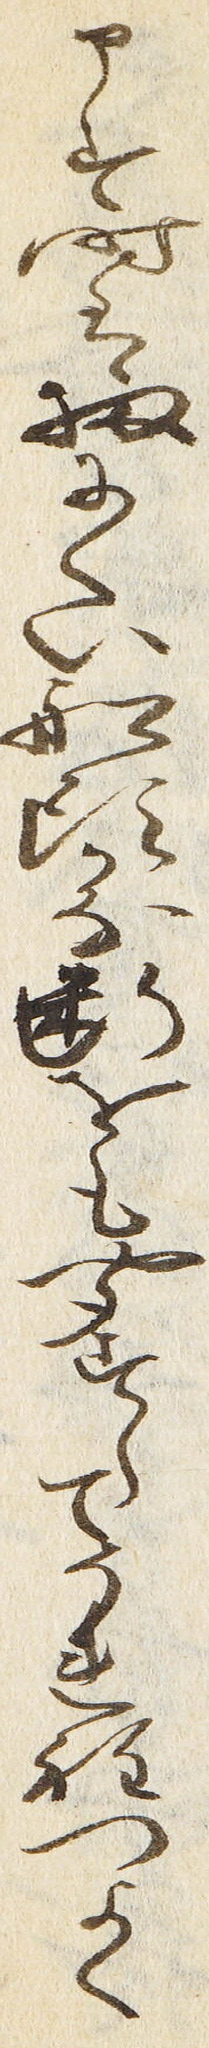申す時は扨にくい船頭かな断をも聞すしてそれ程つよく
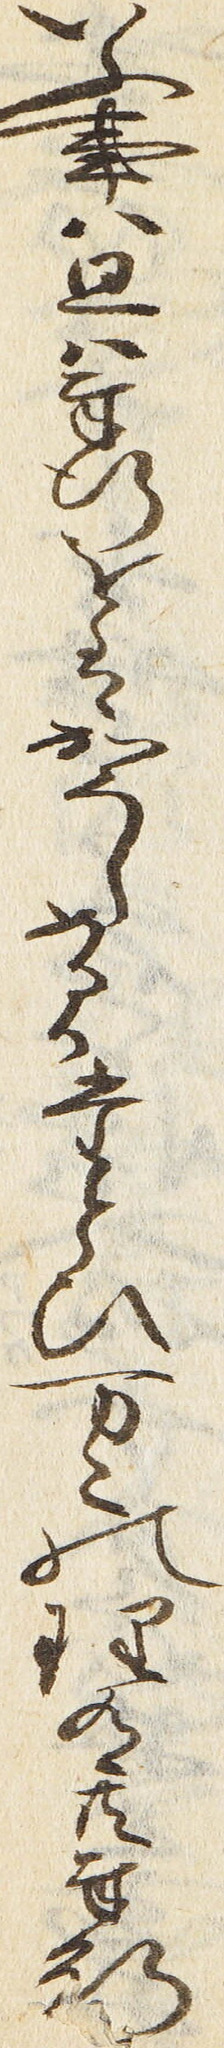いふ事は且は奉行をはかくしめるかたとひ万々の理有共奉行
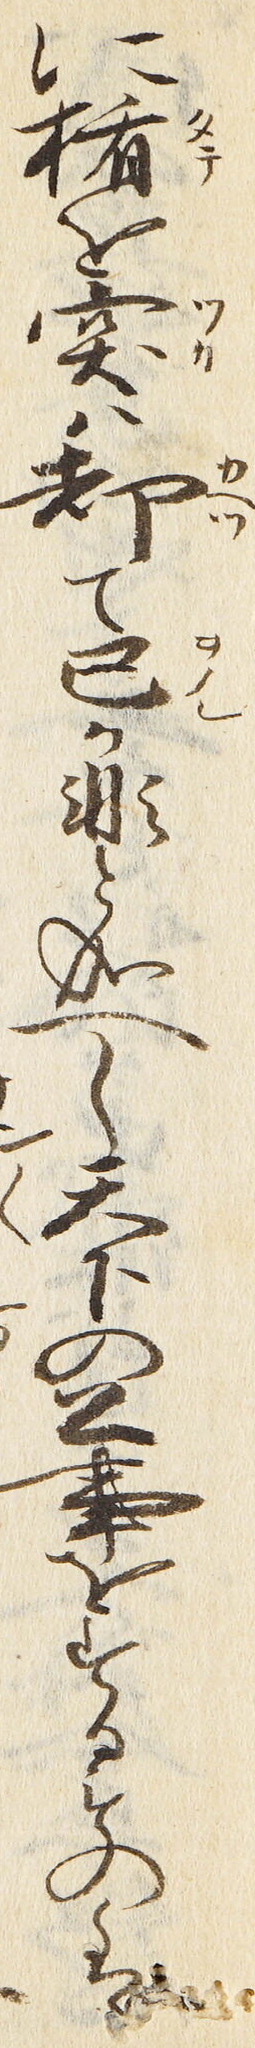に楯を突は却て己か非と成へし天下の公事をするものは
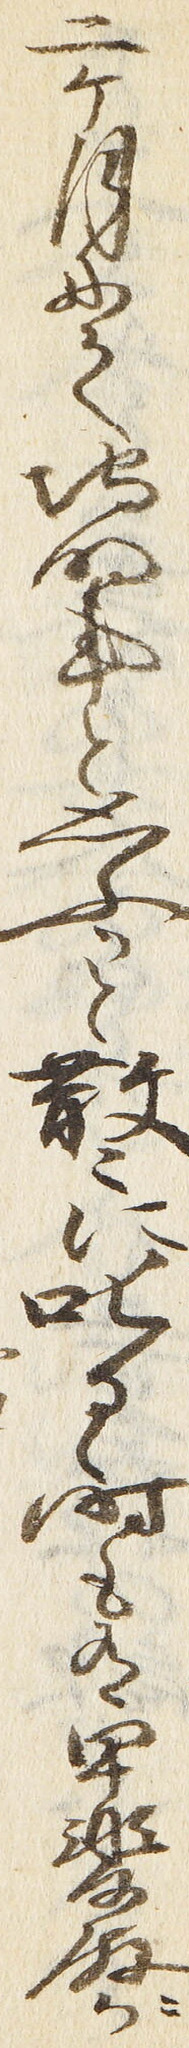二ケ月にて埒明事と思ふかと散々に叱るゝ時も有甲斐殿が
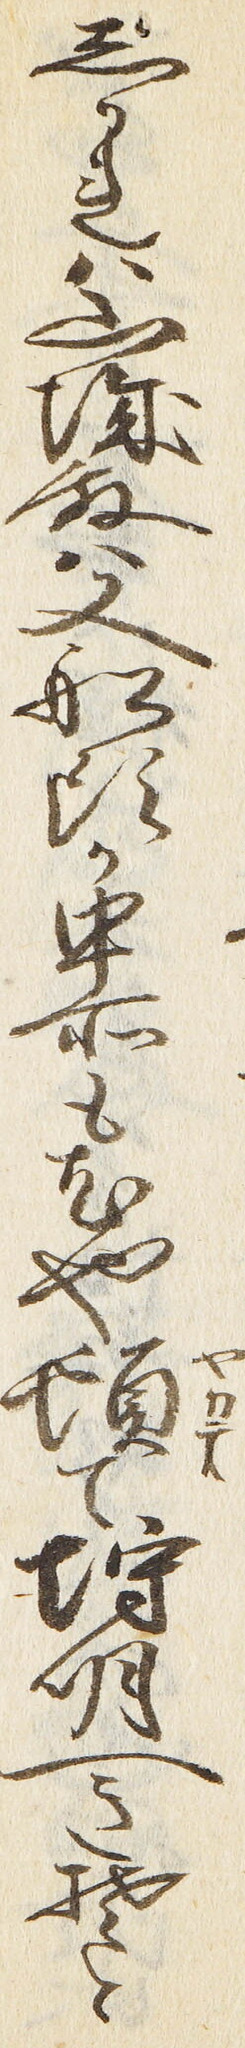しかれは山城殿は又船頭か申所も尤や頓て埒明へきそと
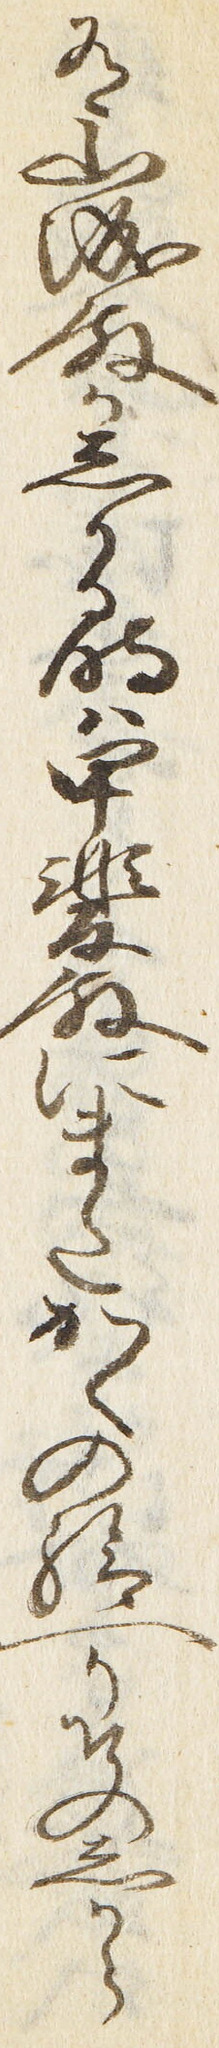有山城殿かしかる時は甲斐殿にまたかくの給へりそのしから
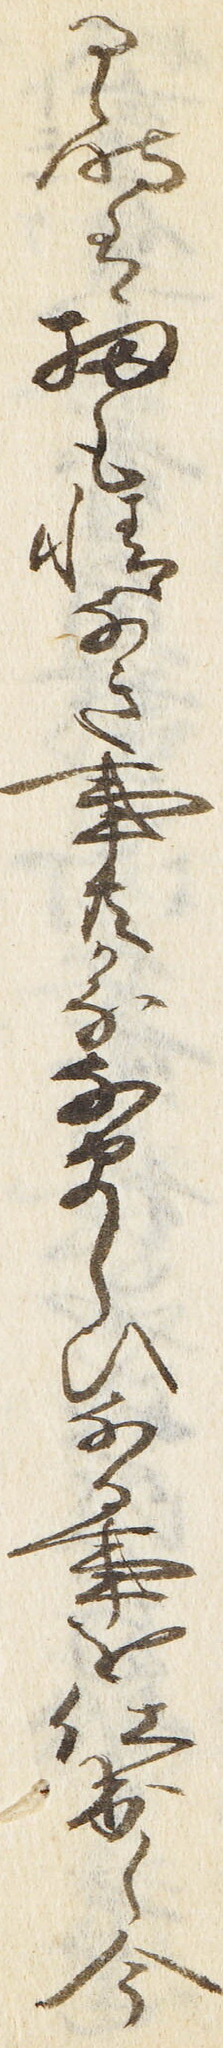るゝ時は扨も情なき事共かななましひなる事を仕出し今
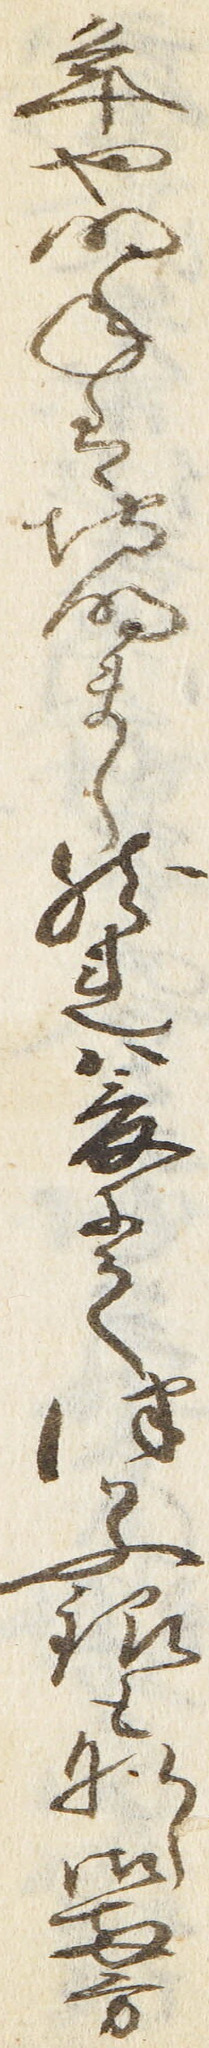年や明年は埒明まし然れは爰にてつかふ銀もなし御両方
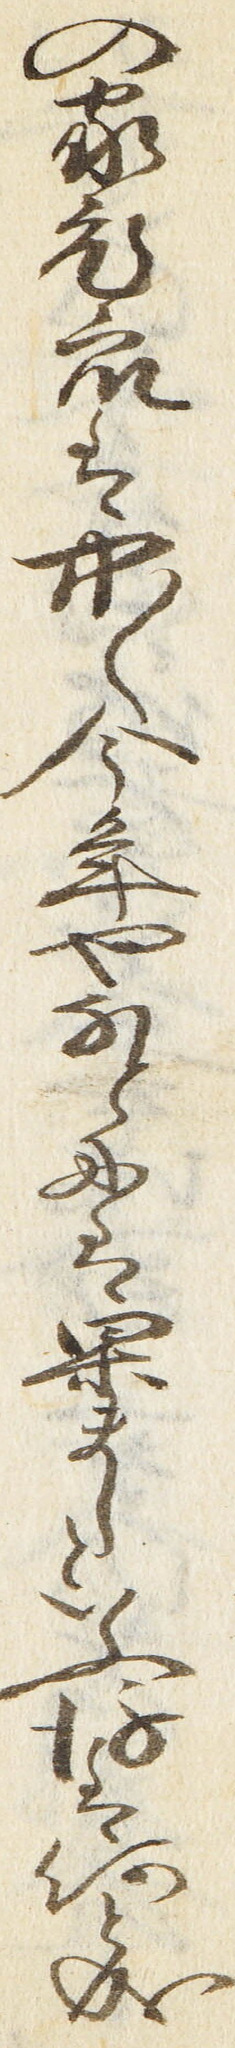の家老衆は中〳〵今年やなとには果ましといふ後は何と成
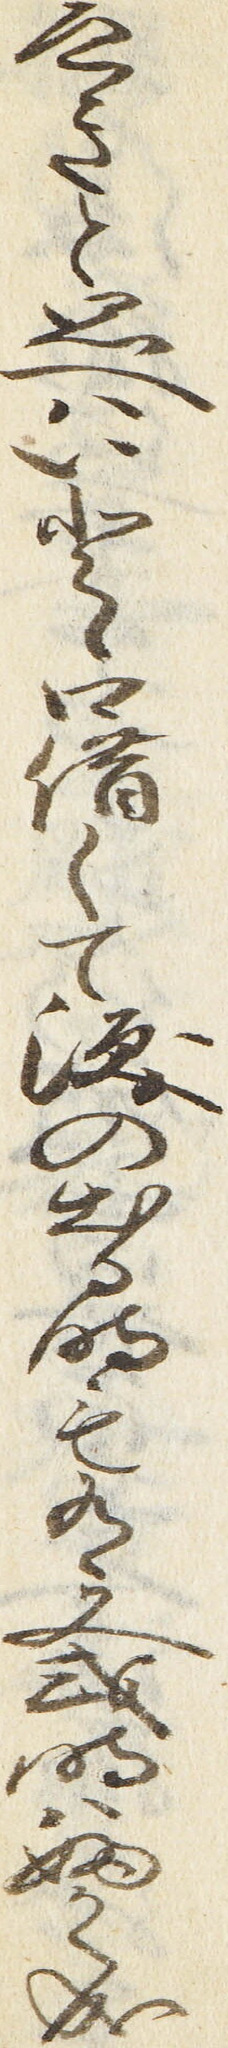へきと思へはいとゝ口惜くて涙の出る時も有又或時はふかく成
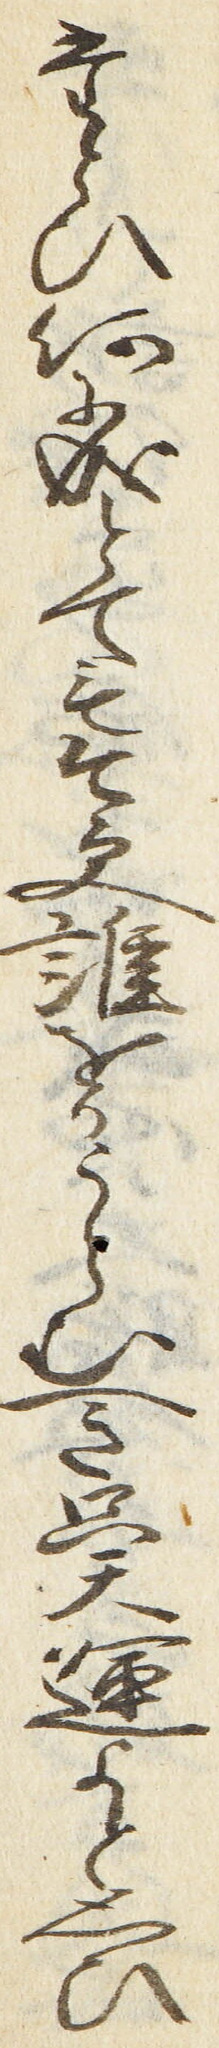たとひ何に成とても今更誰をかうとむへき只天運よと思ひ

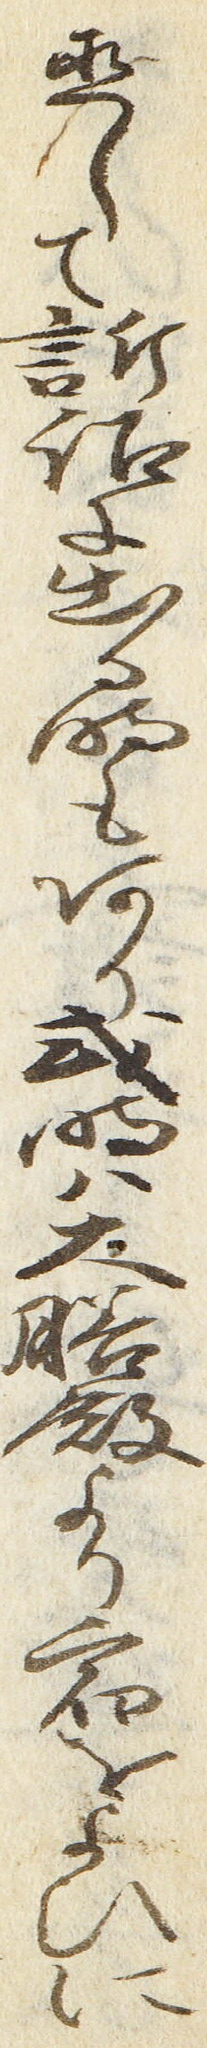直して訴訟に出る時もあり或時は大膳殿より宿をよひに
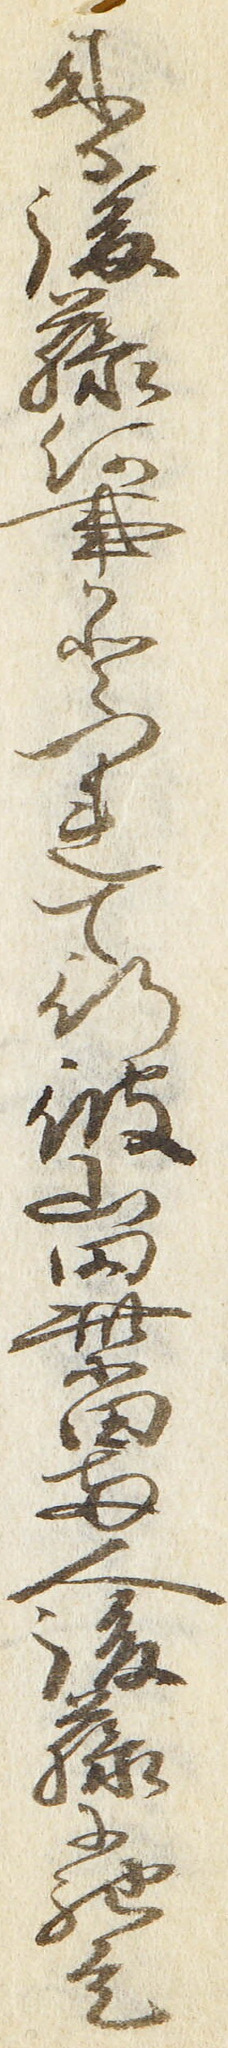来る後藤何事かとつれて行彼山田柴田両人後藤に馳走
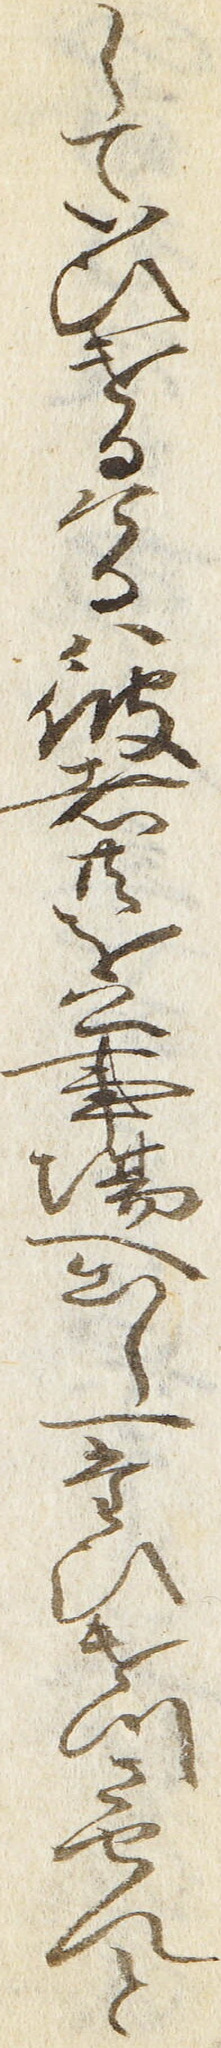していひけるけるは彼者共を公事場へ出し一たひけつさせんと
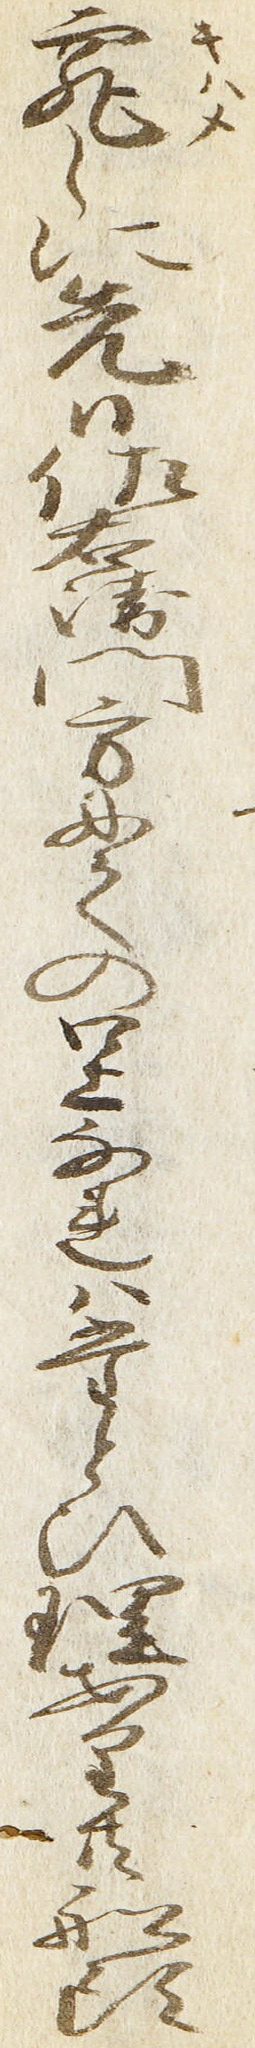究しに先日佐右衛門方にての口上なれはたとひ理あり共船頭
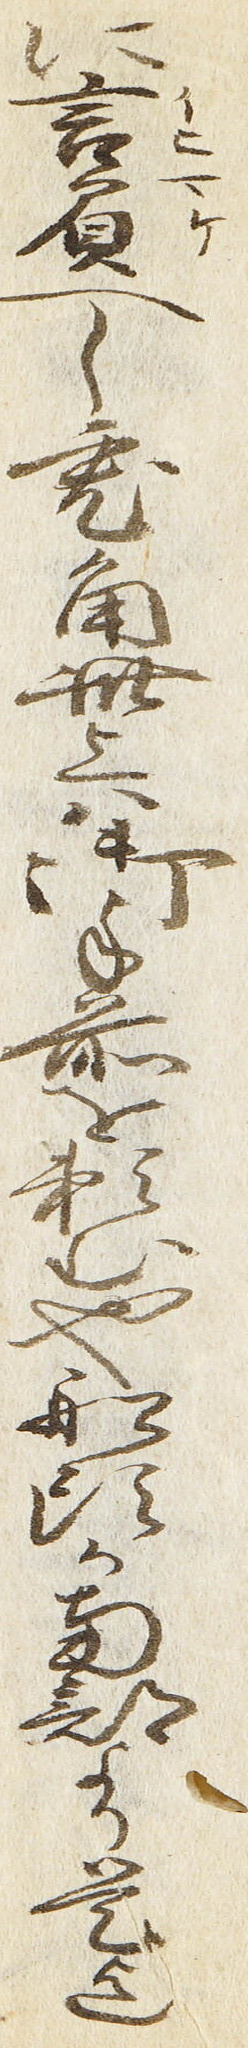に言負へし兎角此上は御手前を頼む也船頭か南部より是迄
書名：海陸世話日記
